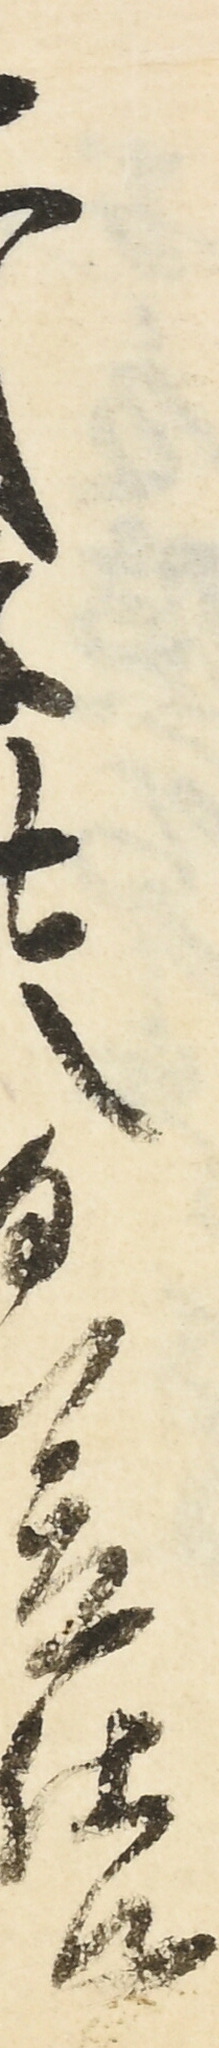右之者廿四日出立仕候
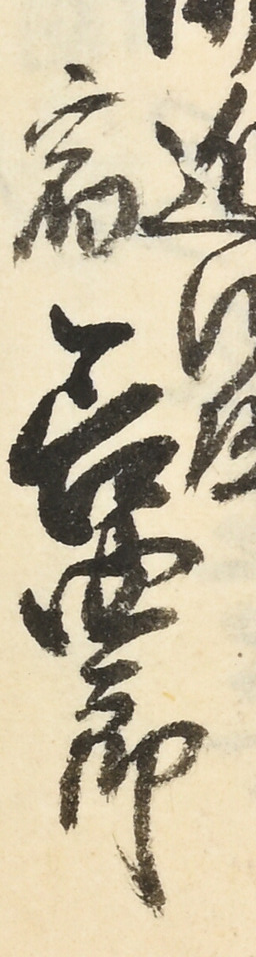宿善四郎

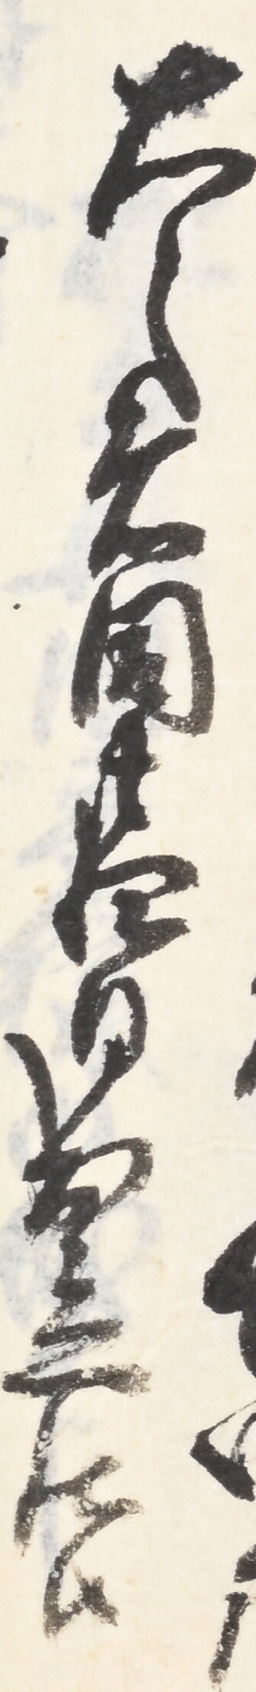右之者廿八日出立仕候
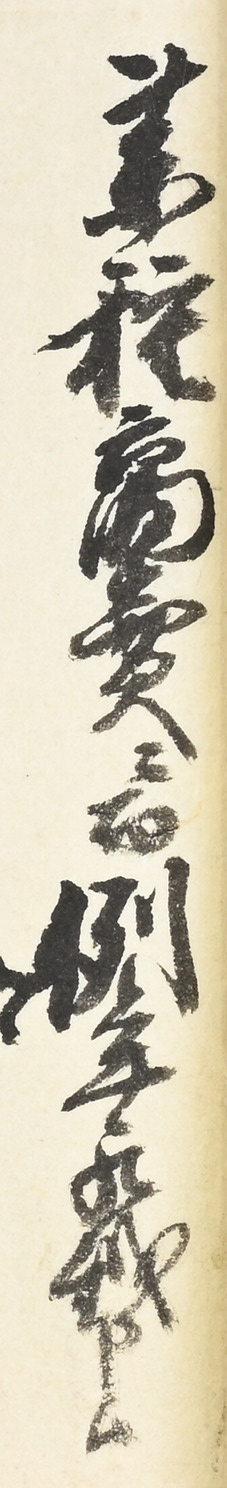薬種商売ニ而例年罷越申候
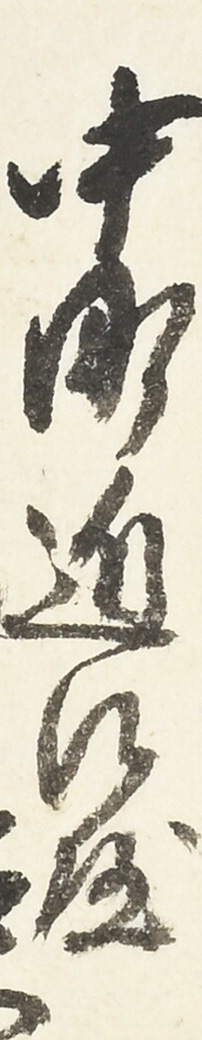中町近江屋
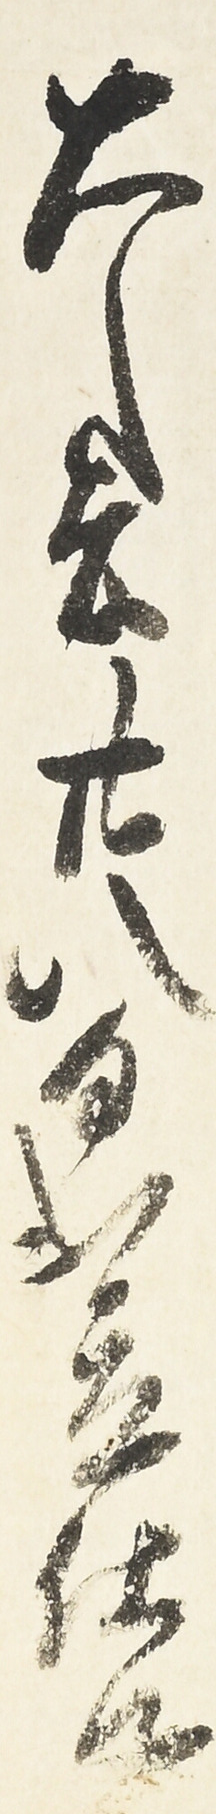右之者廿八日出立仕候
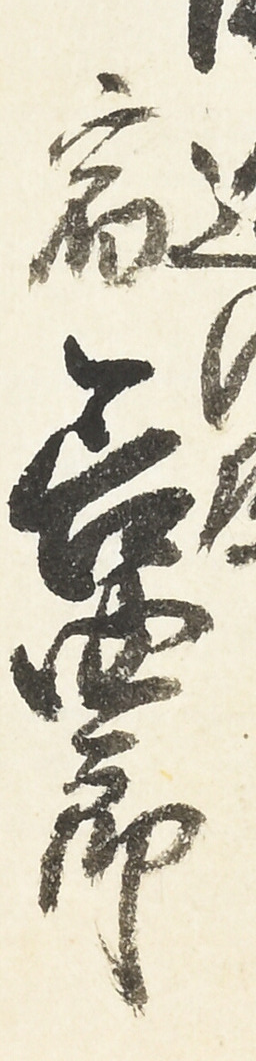宿善四郎
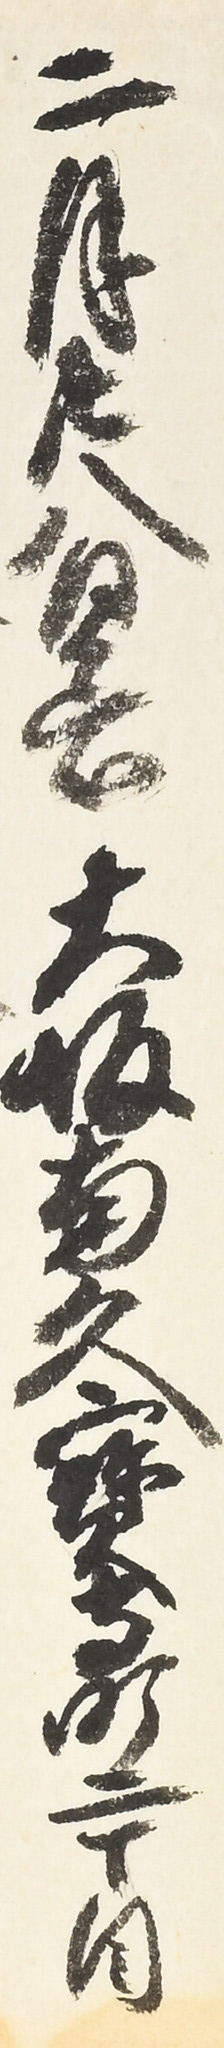二月廿八日着大阪南久宝寺町二丁目
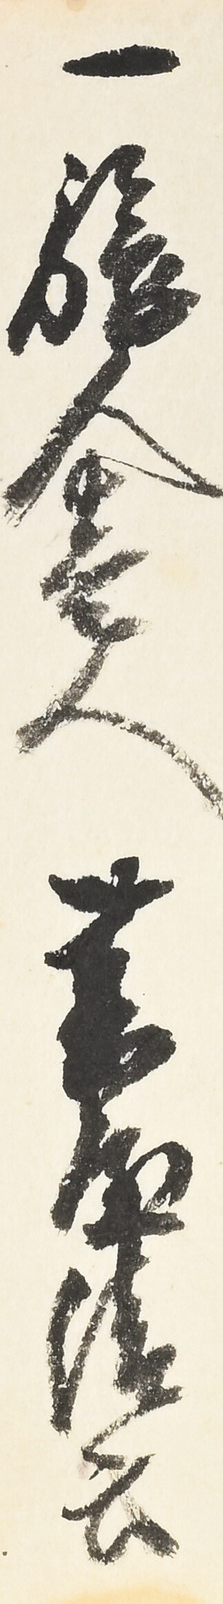一旅人壱人菱屋清六
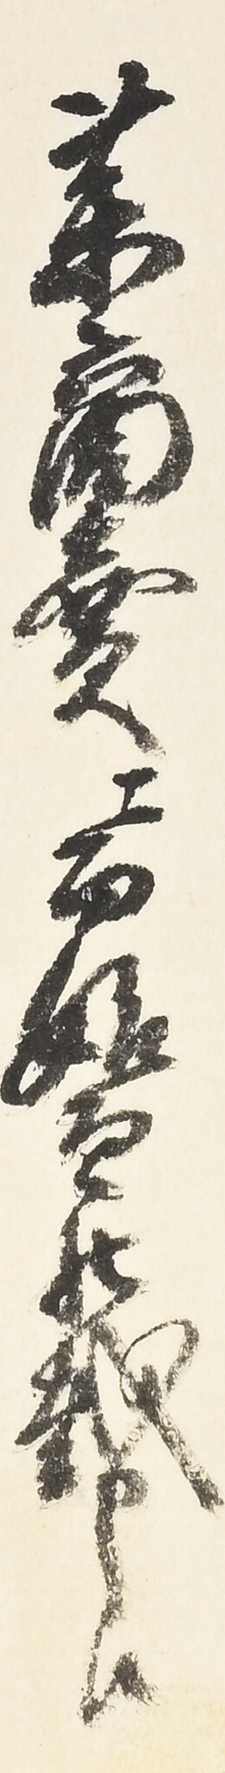薬商売ニ而始而罷越申候
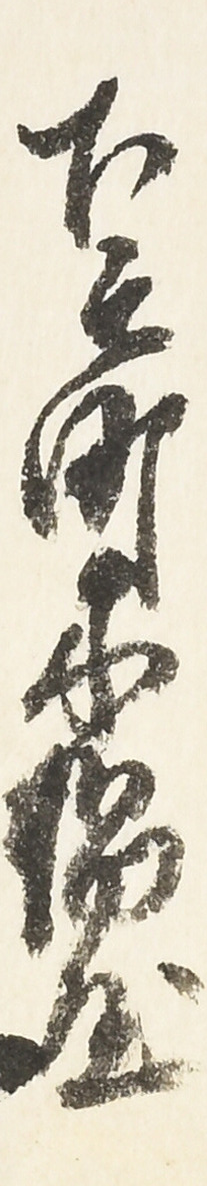下モ町木綿屋
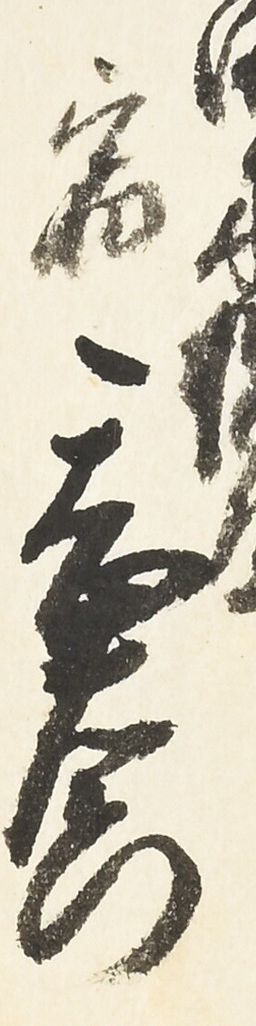宿甚右衛門
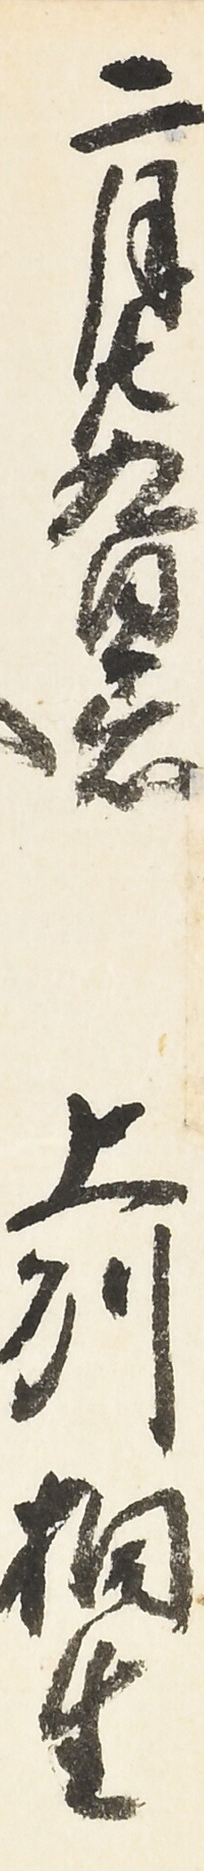弐月廿九日着上州桐生
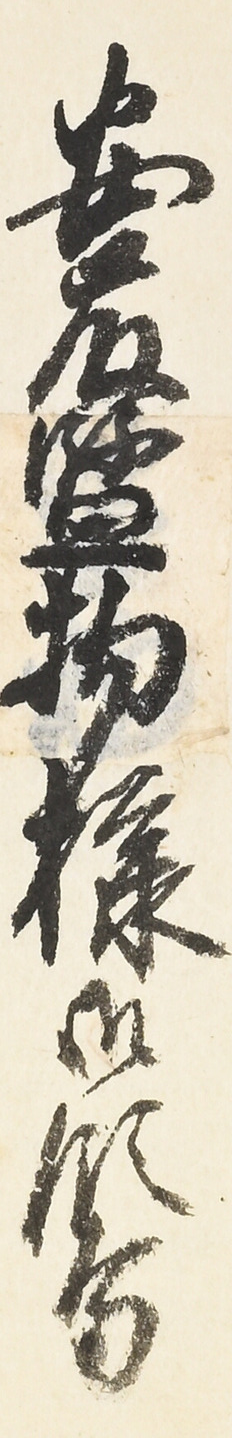安藤監物様御領分
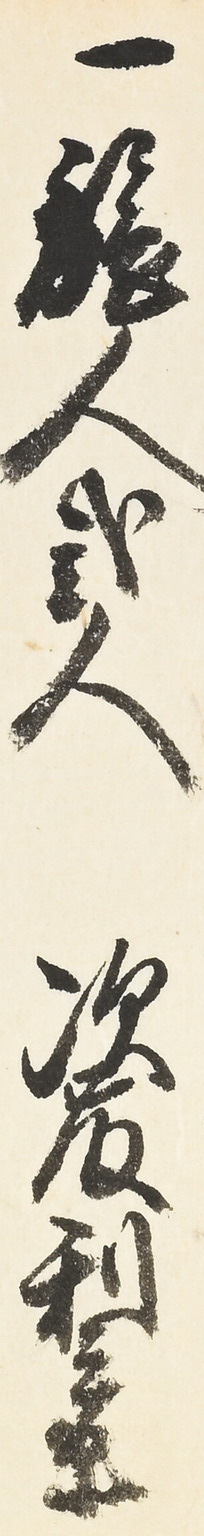一旅人弐人次藤利兵衛
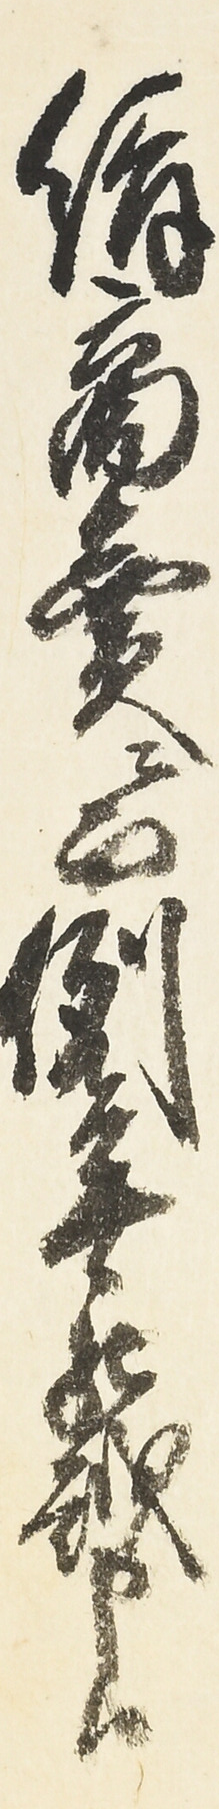絹商売ニ而例年罷越申候
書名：町中旅人泊控帳
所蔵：伊那市立高遠町図書館・合同会社AMANE
